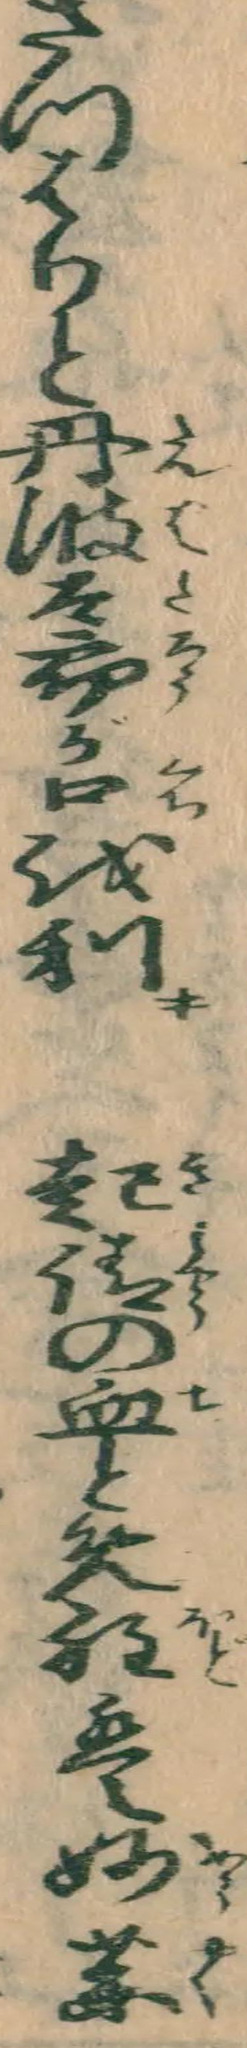さつはりと丹波太郎が口を利起請の血とめ程は妙薬
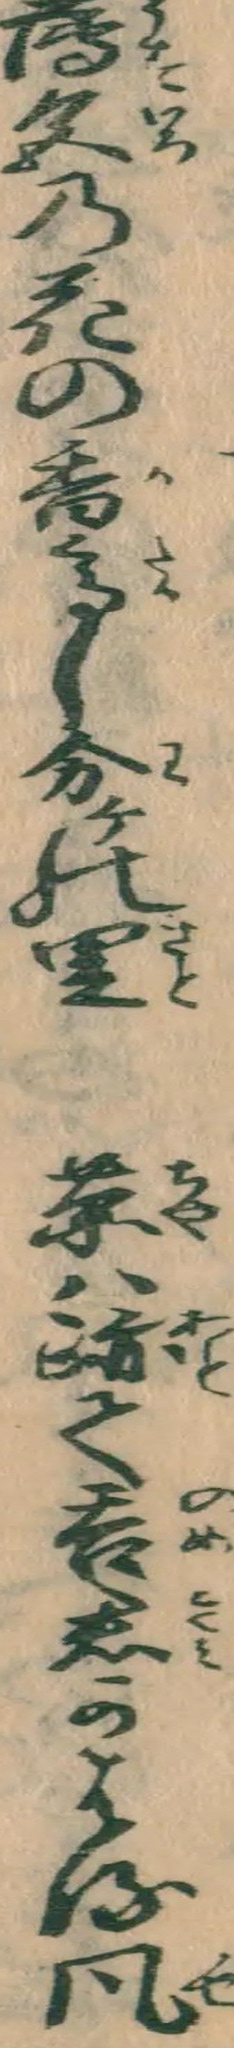薄色の花の香高し分ヶの里茶は跡て呑君かはる風
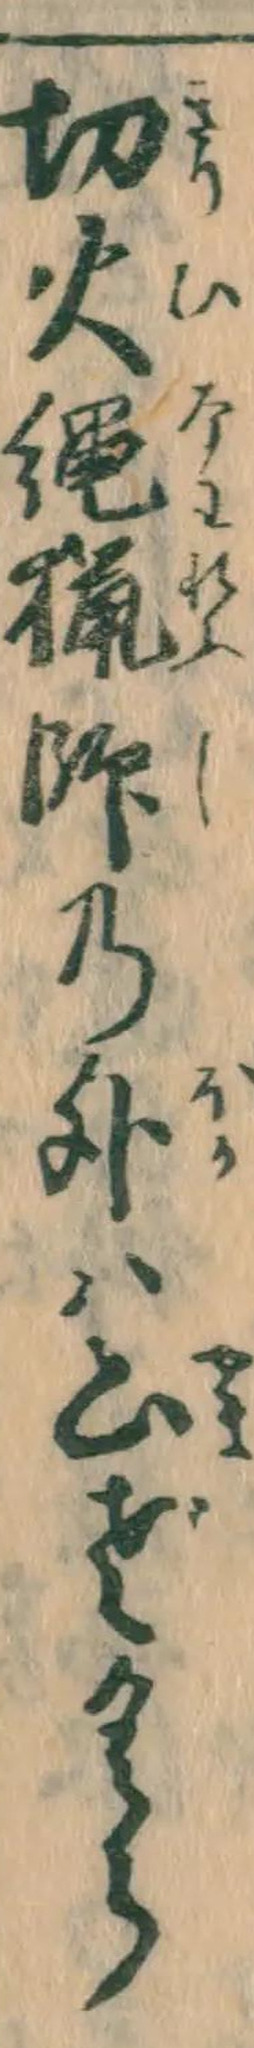切火縄猟師の外は山ざくら
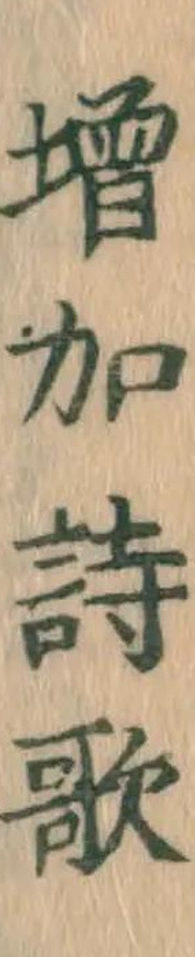増加詩歌

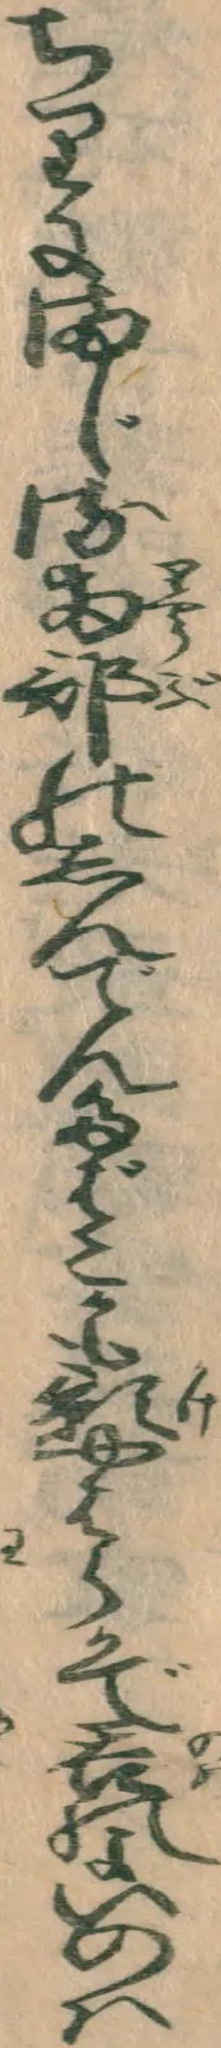ちりにまじる両部のしんでんたばこかも影やはらかで呑のよいのは
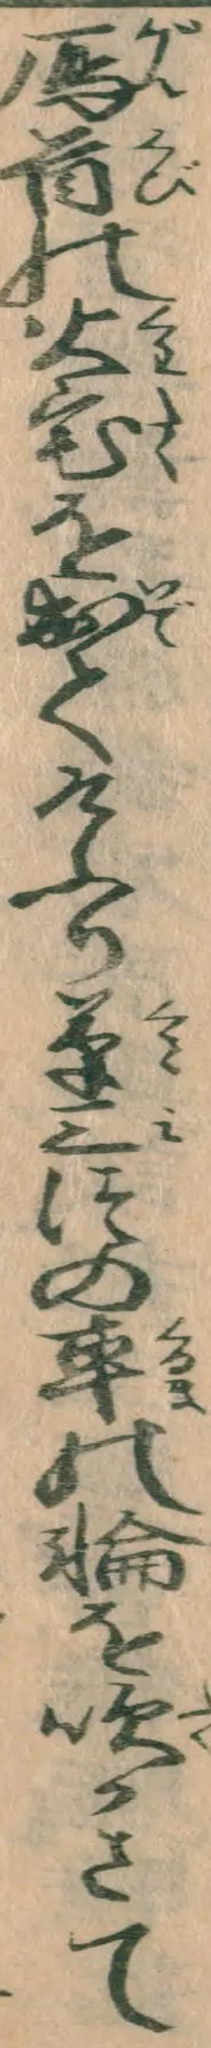雁首の火宅を出てけふり草三つの車の輪を吹かさて
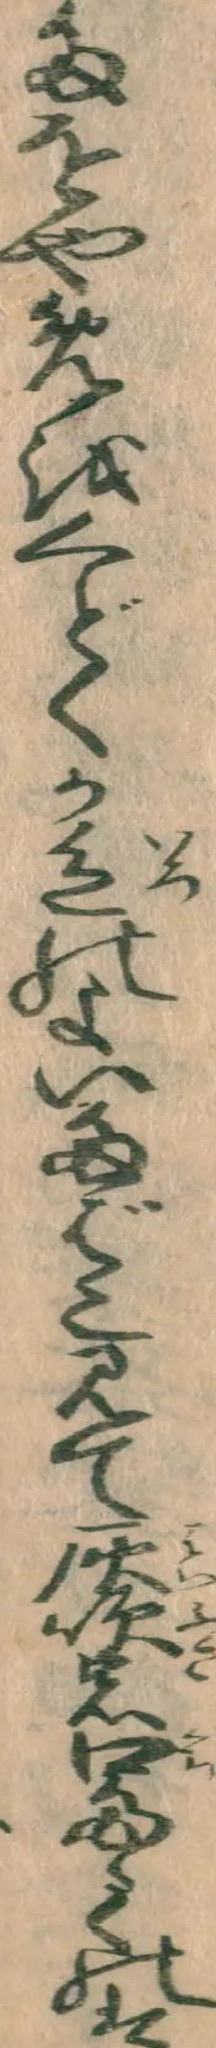たをやめをくどくか色のよいたばこ見て灰吹の口たゝくのは
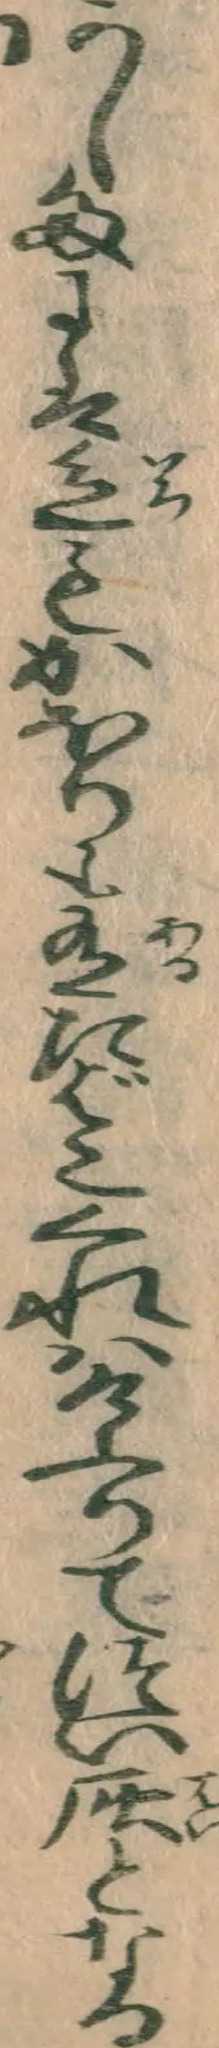あしたには色もかほりも有たばこくれはけふりてつい灰となる
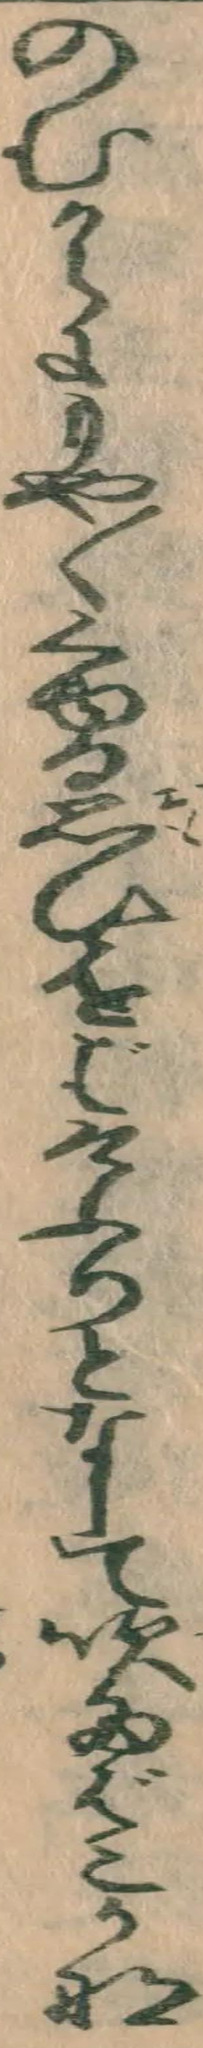のむからにもや〳〵くゆる思ひをばけふりとなして吹たばこかな
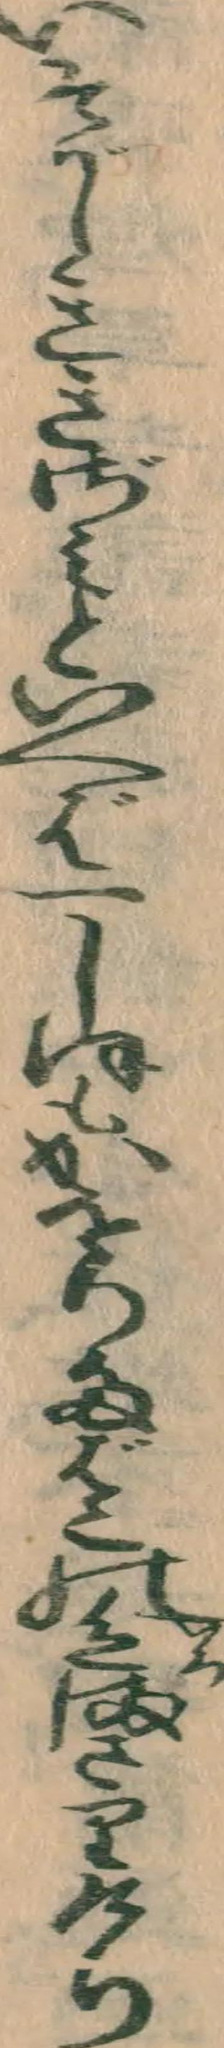いそがしききざみといへば一しほもかをりたばこの色まさりけり
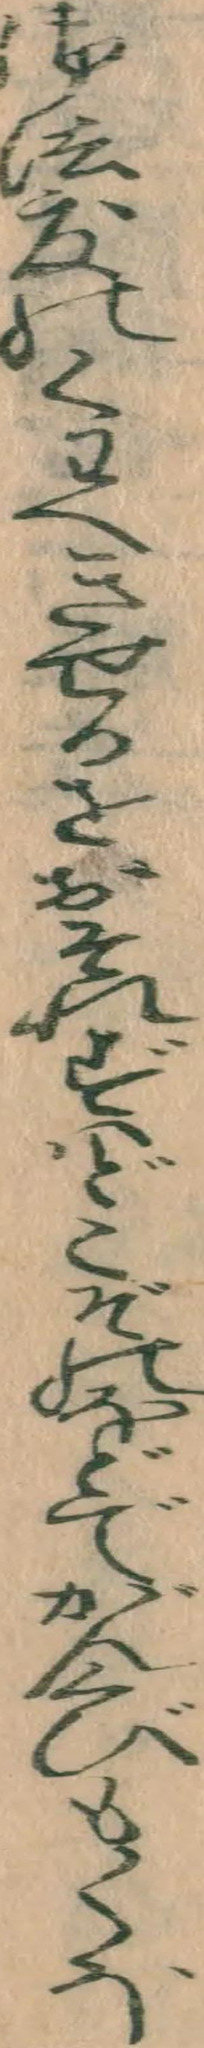御法度のくわへきせるをおそれずはどこぞのほどでがんくびもくう？
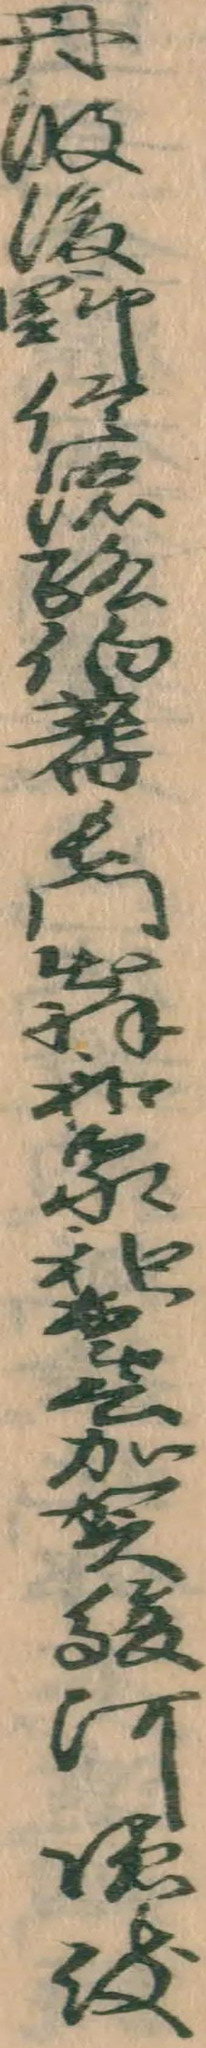丹波後野信濃路伯耆長門出羽和泉出雲加賀駿河隠岐
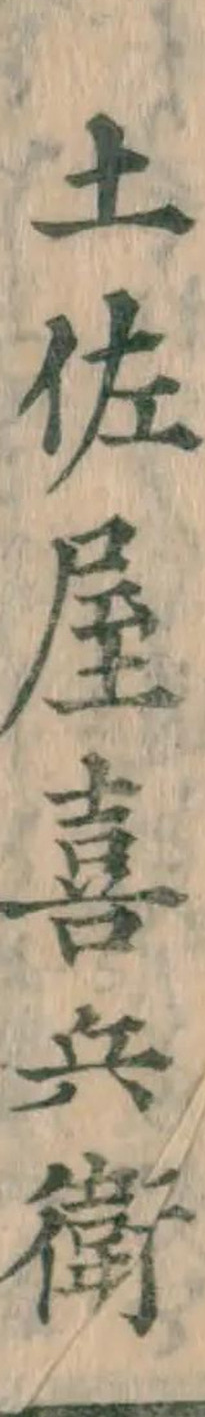土佐屋喜兵衛

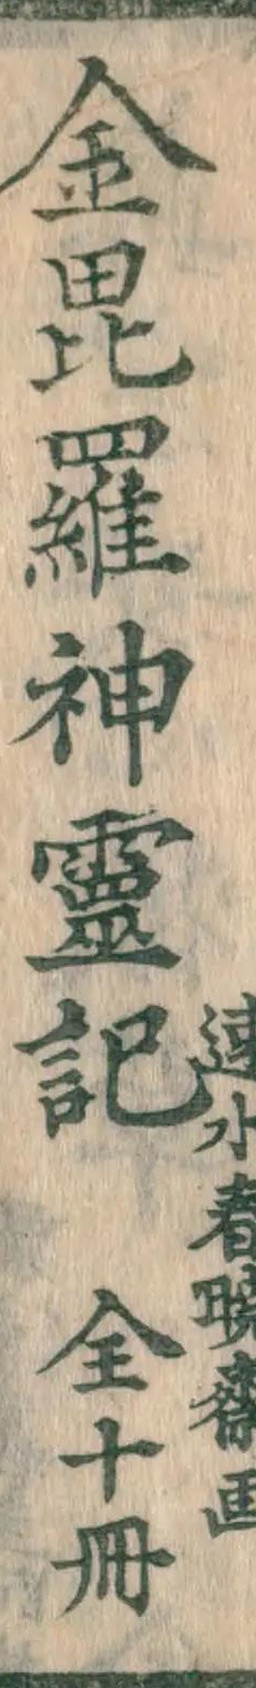金毘羅神霊記全十冊

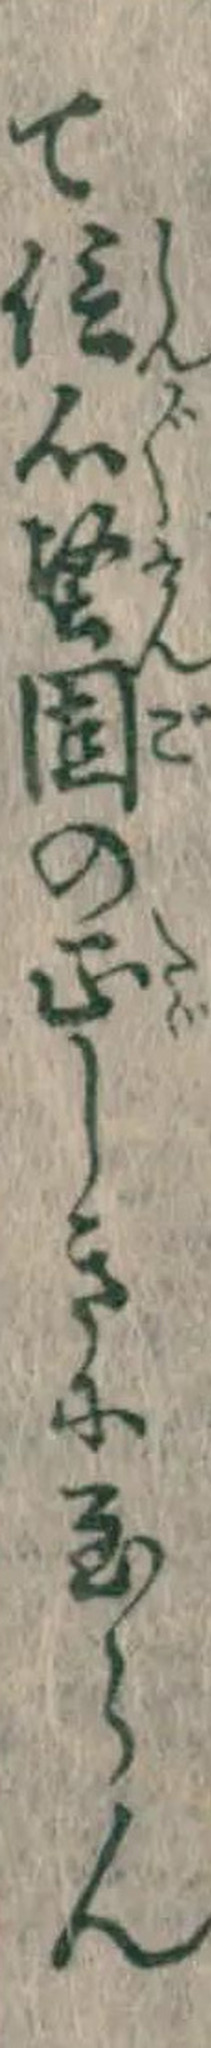て信心堅固の正しきに至らん

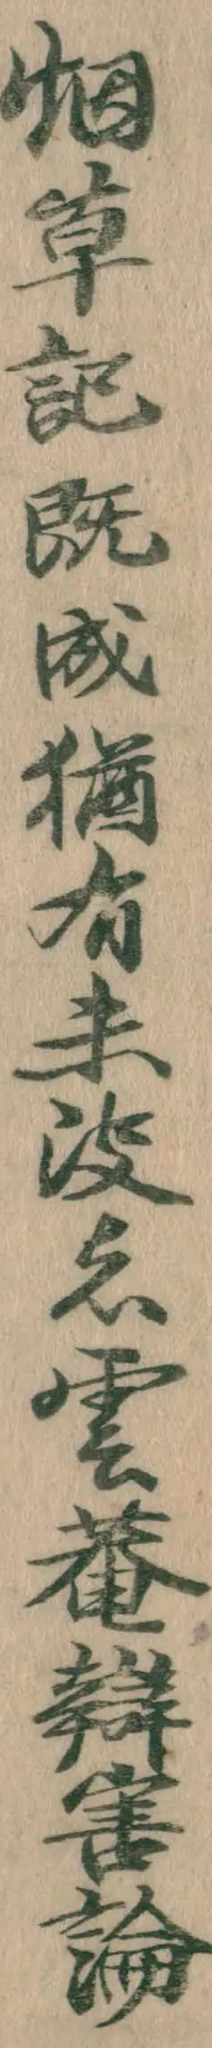烟草記既成猶有未決者雲菴弁害論
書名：煙草記
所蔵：国立国会図書館 National Diet Library, JAPAN
